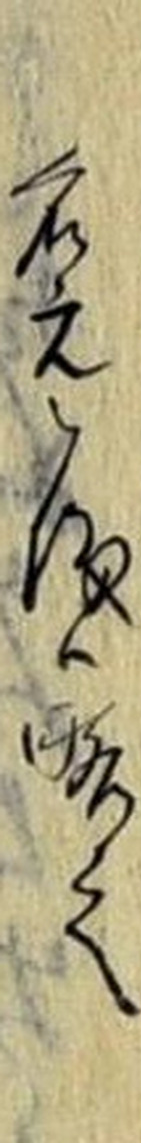名元之儀は略之
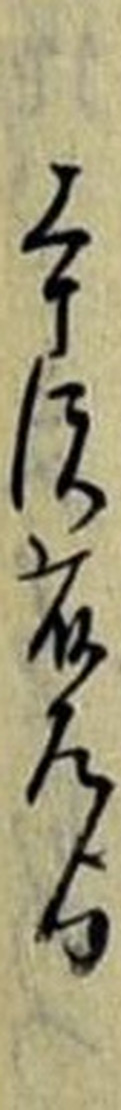寺沢藤左衛門
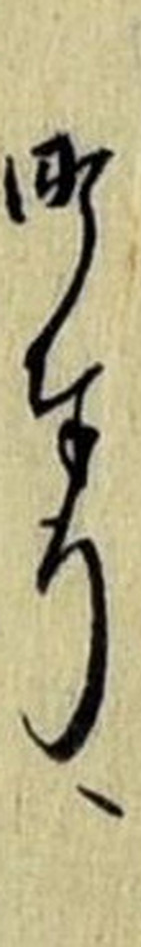御奉行へ
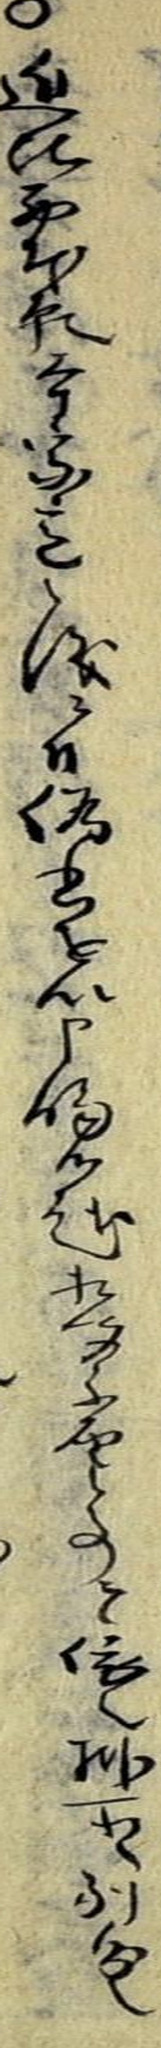○近頃西本願寺宗意之儀に付偽書を以申触候趣相聞不届之事に候依之掛所へ別紙之
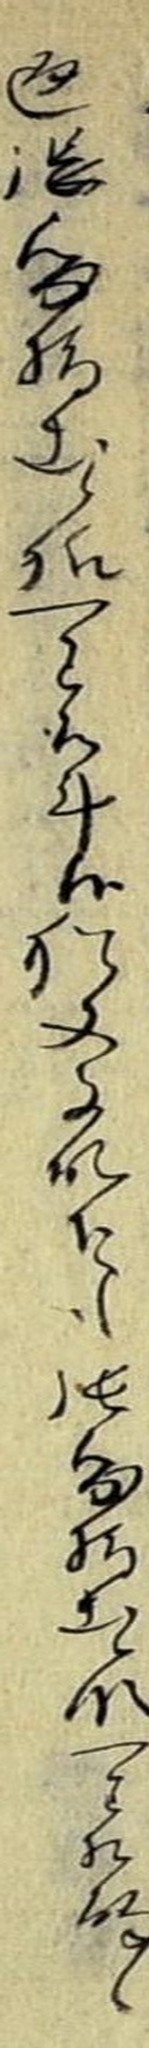通張紙指出候様可被取斗候猶又支配下へも張紙指出候様可被相触候
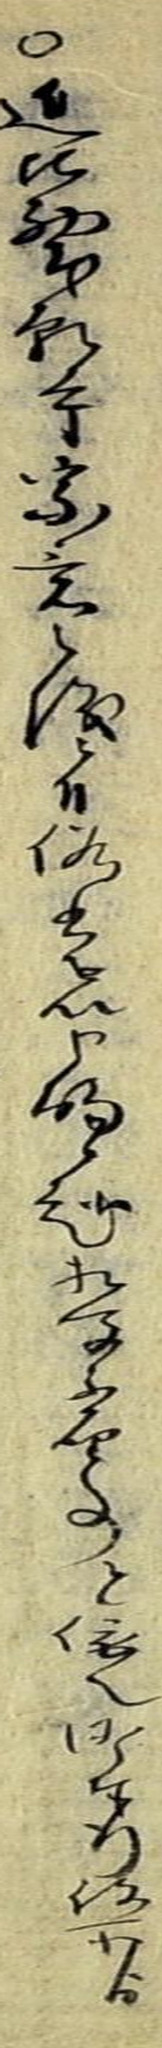○近頃西本願寺宗意之儀に付偽書を以申触候趣相聞不届之事に候依之御奉行役所ゟ
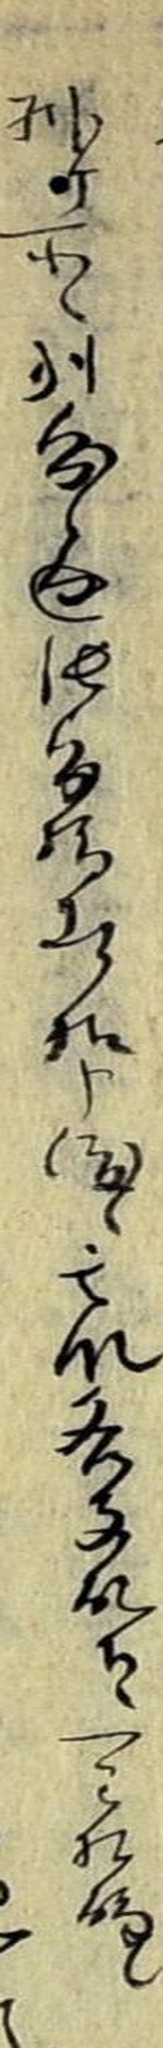掛ヶ所へ別紙之通張紙指出候様申渡候其段各支配下へ可被相触候
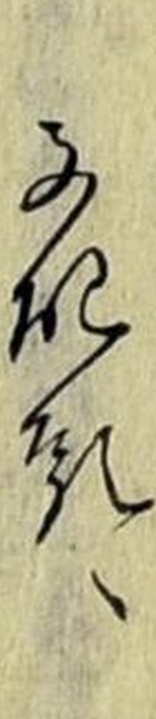支配頭へ
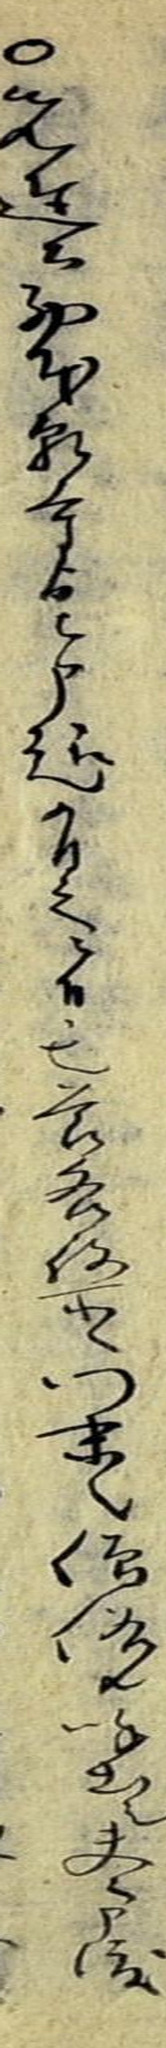○先達而西本願寺ゟ被申越有之に付其節各役所へ門末之僧俗共呼出夫々申渡
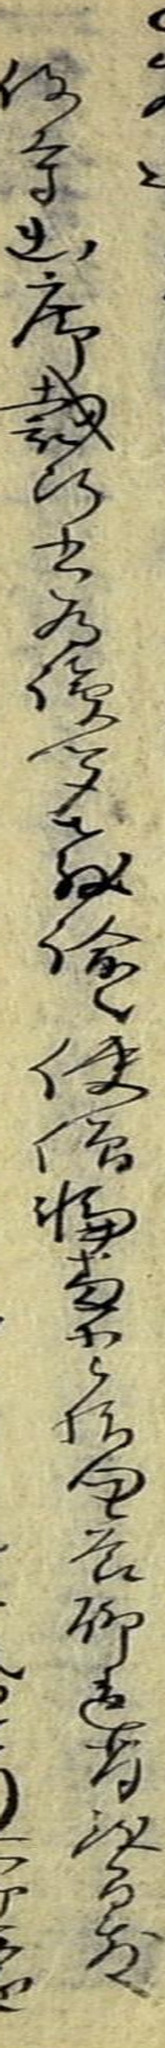役寺出席裁断書為続聞教諭之使僧輪番等被指向候節聊違背致間敷
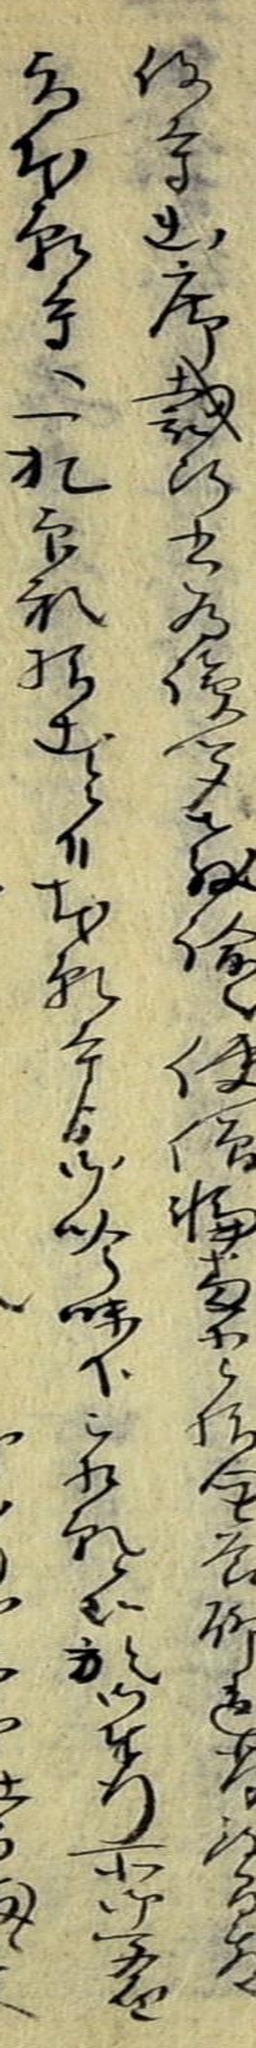旨本願寺へ一札印形指出候に付本願寺ゟ御吟味下被相願候処於御奉行所御聞届
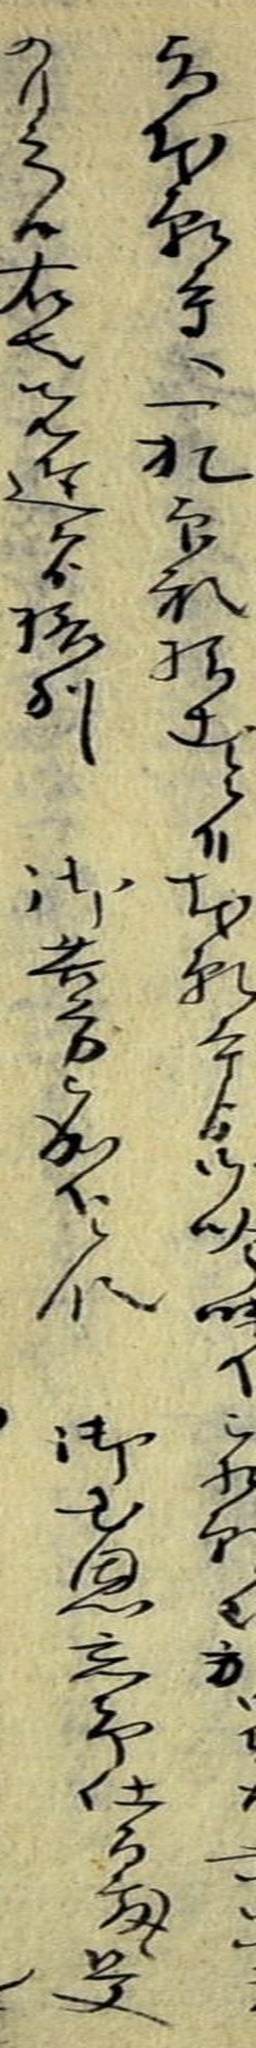有之候右は先達而ゟ格別御苦労被成下候段御国恩忘却仕間敷候且又
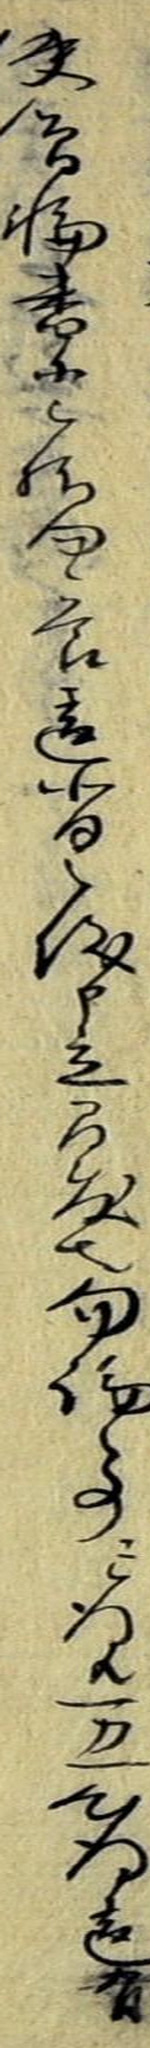使僧輪番等被指向候節違背之儀申立間敷は勿論之事に候得共万一心得違有

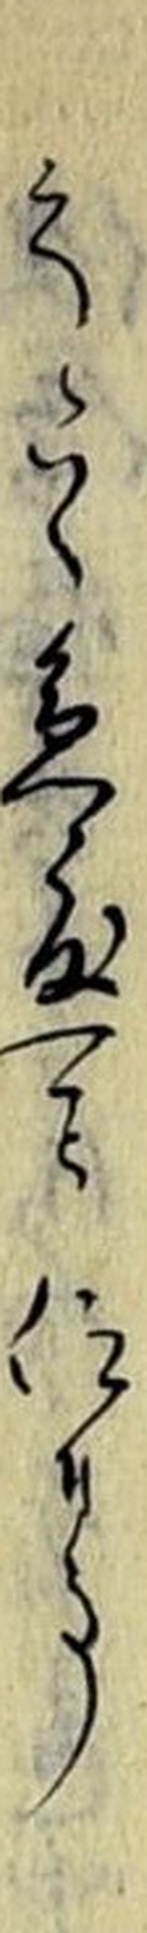之候ハゝ急度可被仰付事
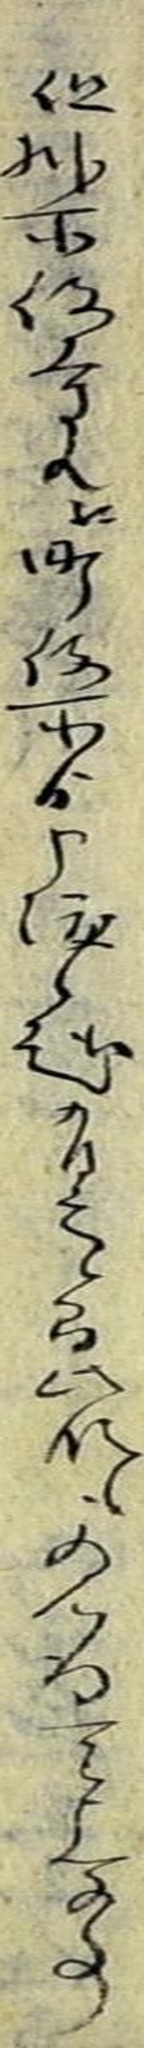但掛所役寺共江町役所ゟ申渡候趣可有之候間此段も為心得可被申聞事
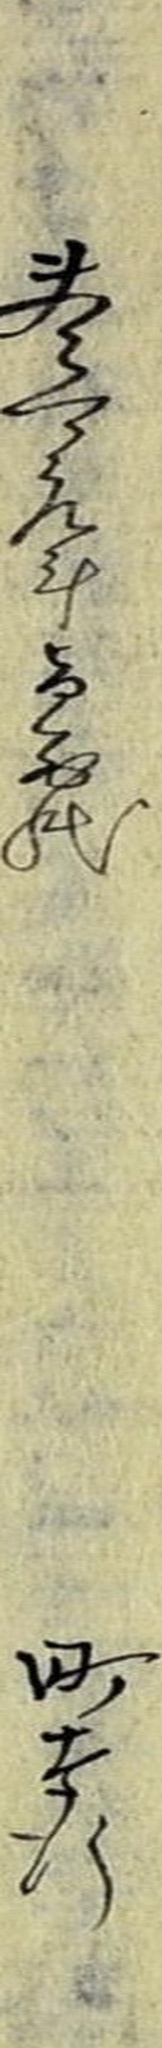夫々可取斗旨別紙町奉行
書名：命令之部 四
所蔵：福井県文書館 Fukui Prefectural Archives
